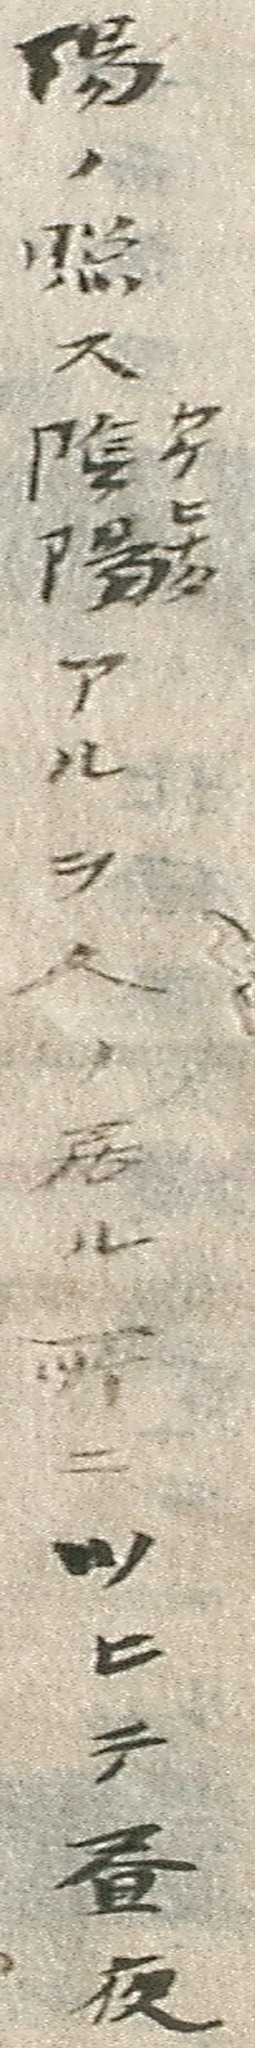陽ノ照ス陰陽アルヲ人ノ居ル所ニツヒテ昼夜
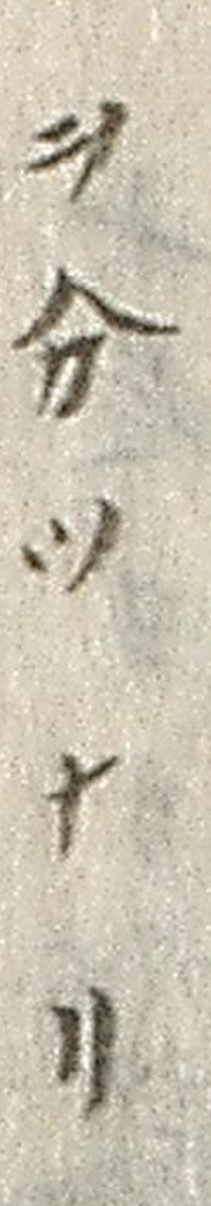ヲ分ツナリ
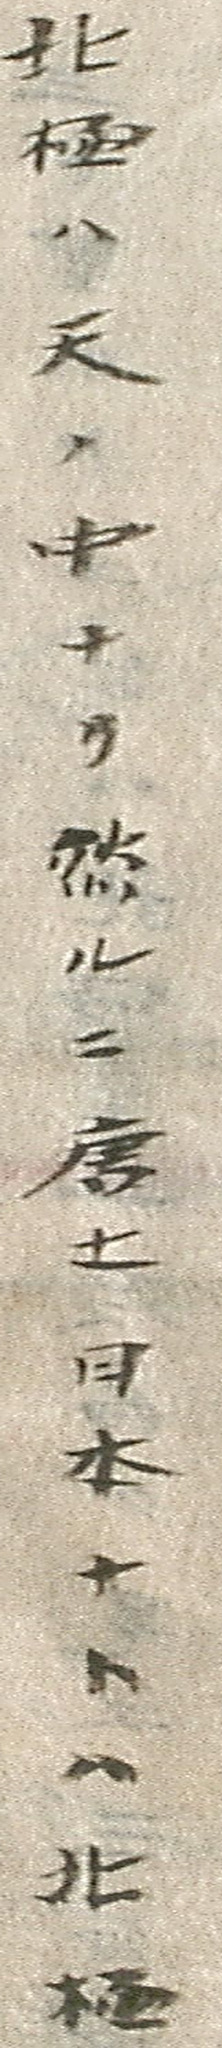北極ハ天ノ中ナリ然ルニ唐土日本ナトハ北極
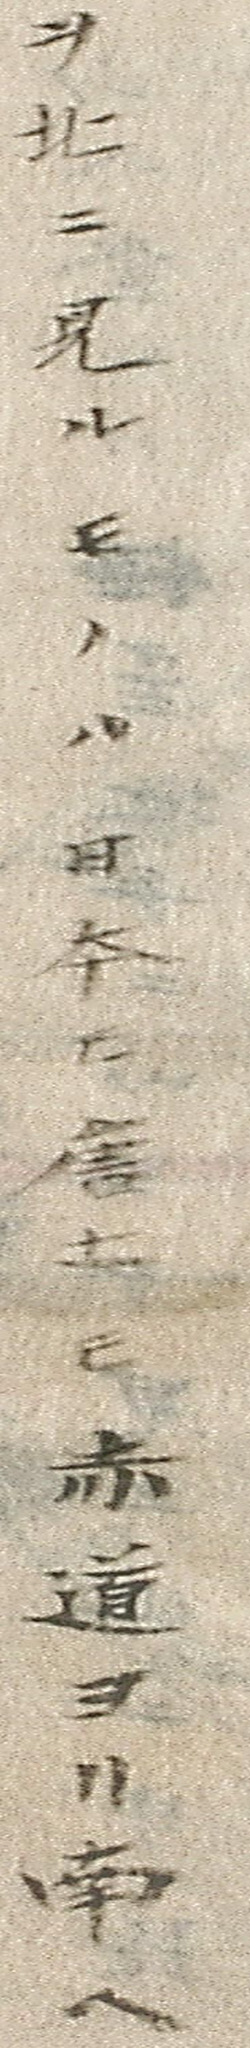ヲ北ニ見ルモノハ日本モ唐土モ赤道ヨリ南ヘ
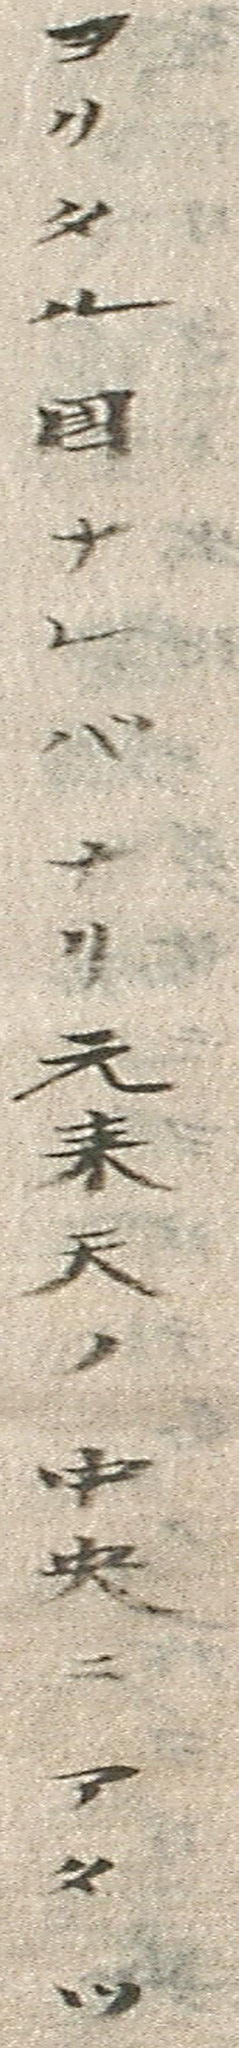ヨリタル国ナレバナリ元来天ノ中央ニアタツ
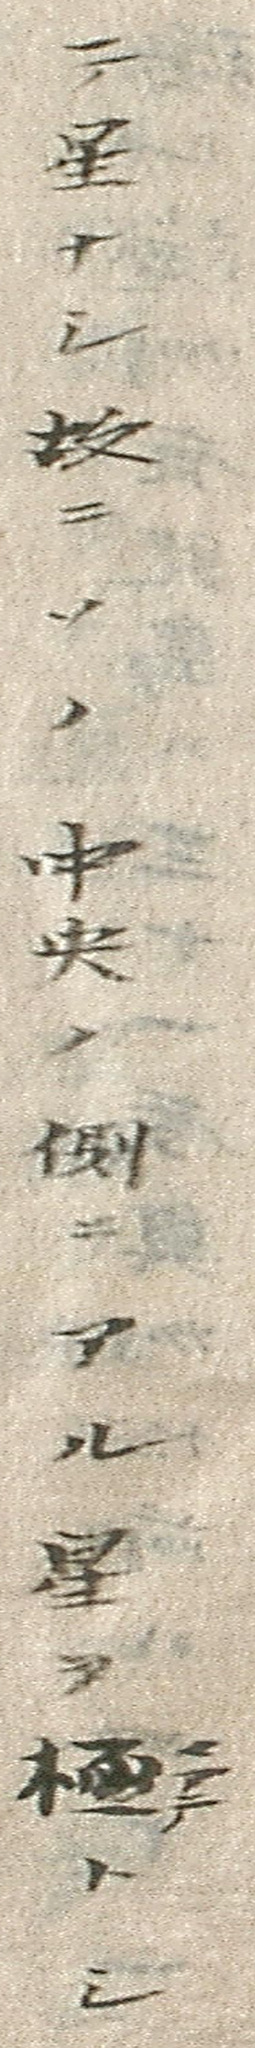テ星ナシ故ニソノ中央ノ側ニアル星ヲ極トシ
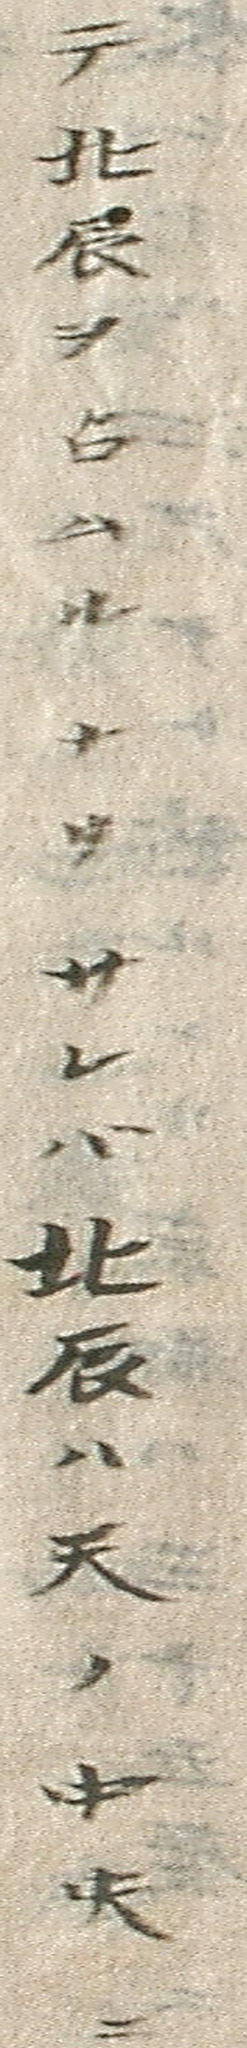テ北辰ヲ占ムルナリサレバ北辰ハ天ノ中央ニ
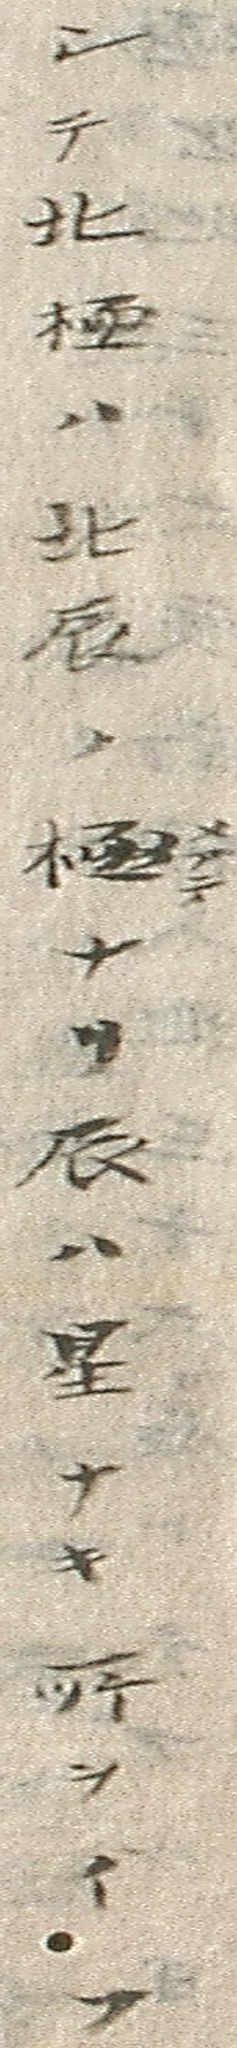シテ北極ハ北辰ノ極ナリ辰ハ星ナキ所ヲイフ
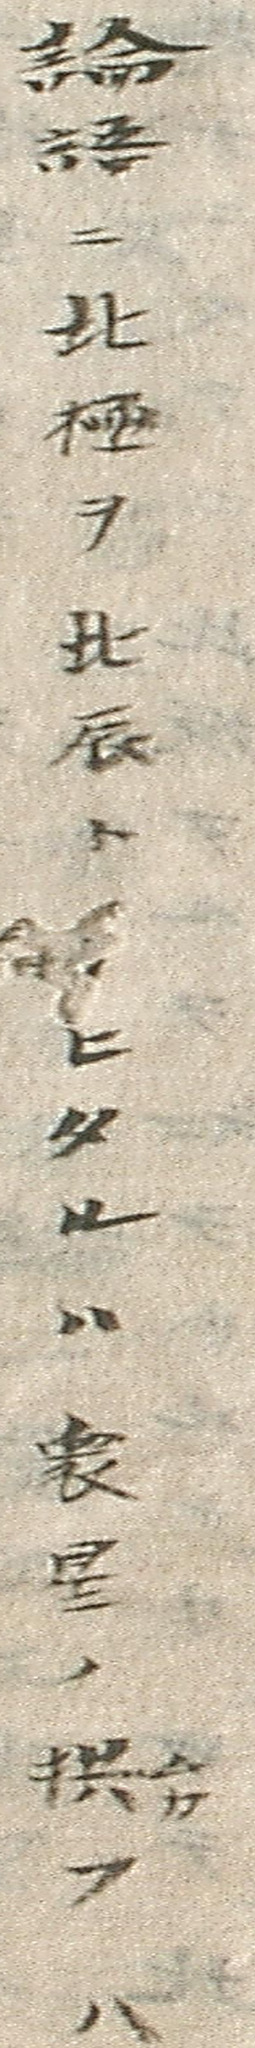論語ニ北極ヲ北辰トイヒタルハ衆星ノ拱フハ
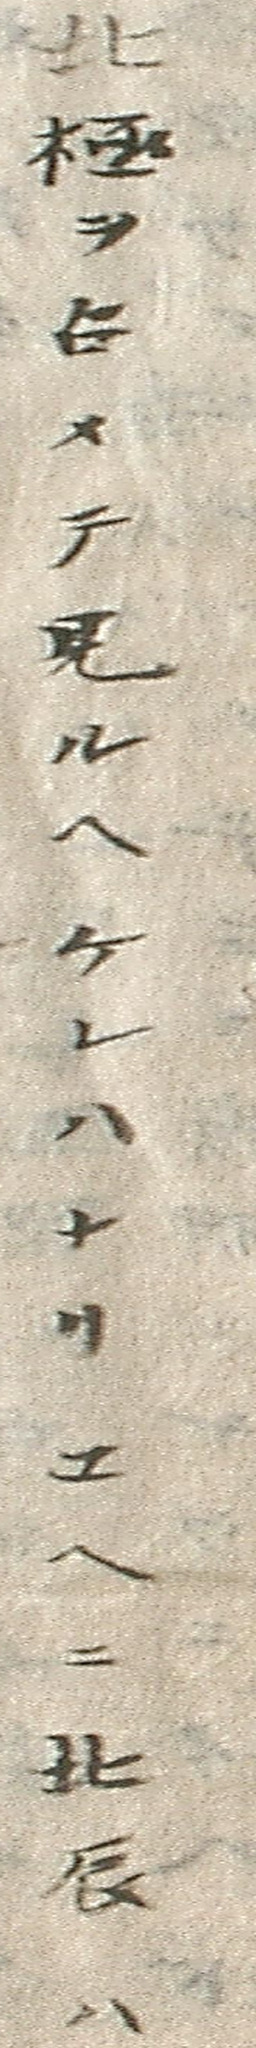北極ヲ占メテ見ルヘケレハナリユヘニ北辰ハ
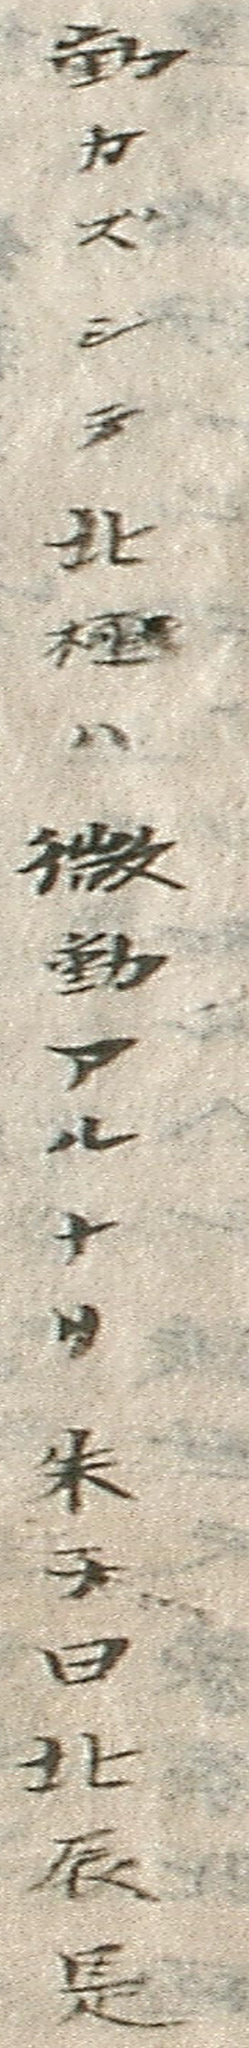動カズシテ北極ハ微動アルナリ朱子曰北辰是

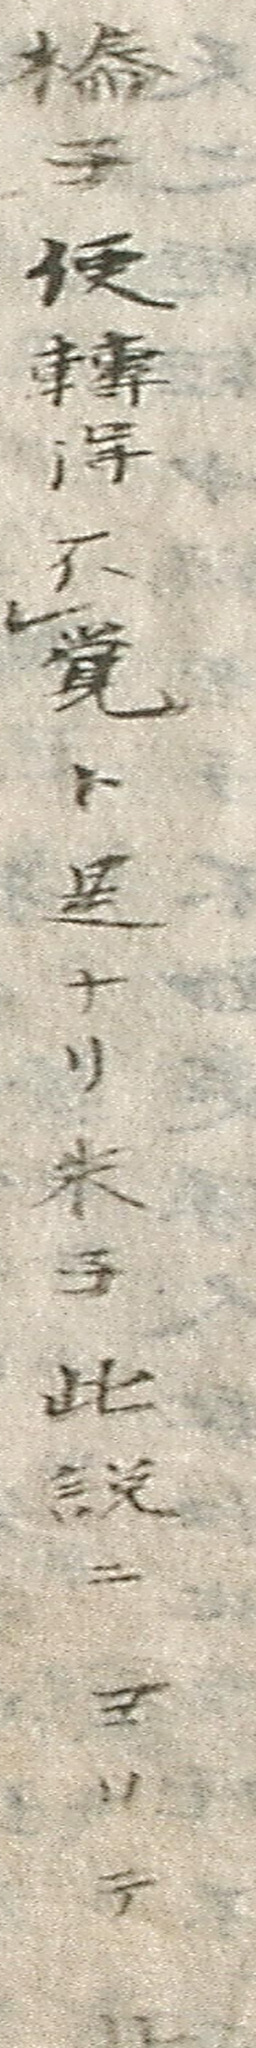樁子便轉得不覚ト是ナリ朱子此説ニヨリテ北
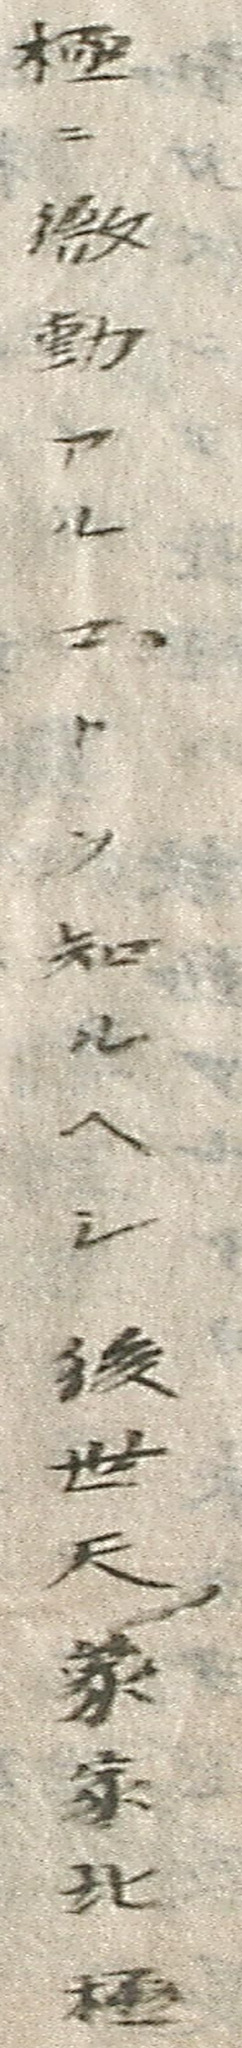極ニ微動アルコトヲ知ルヘシ後世天蒙家北極
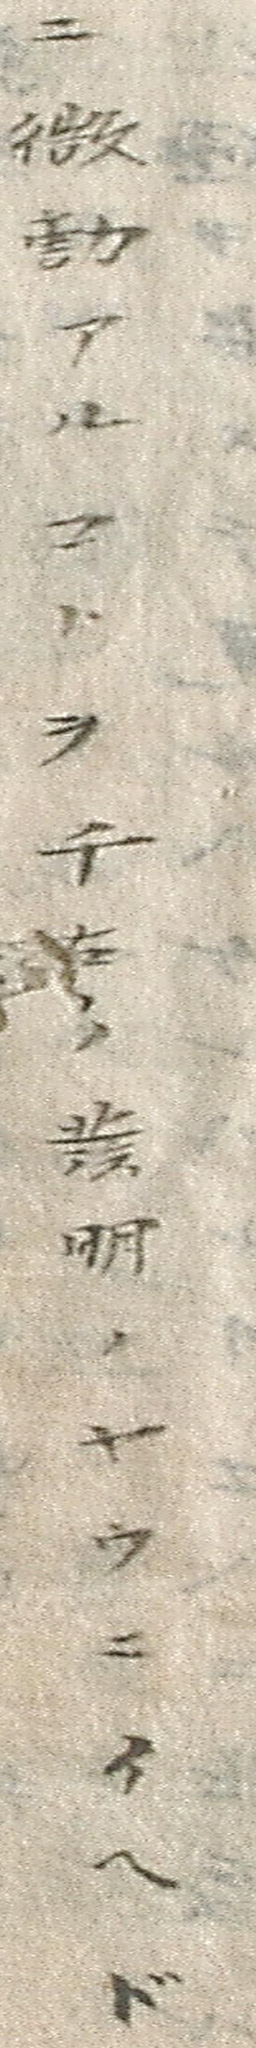ニ微動アルコトヲ千右ノ発明ノヤウニイヘド
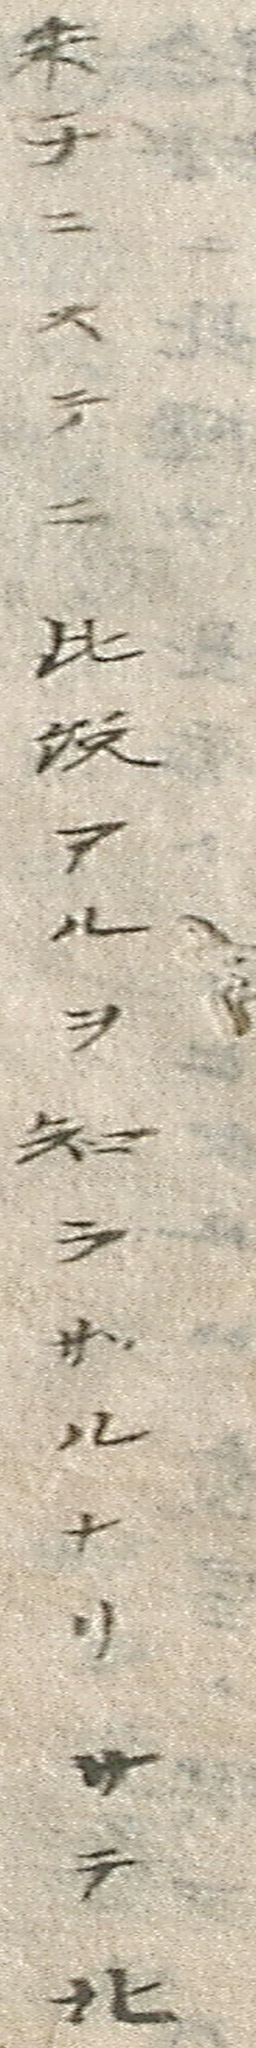朱子ニステニ此説アルヲ知ラザルナリサテ北
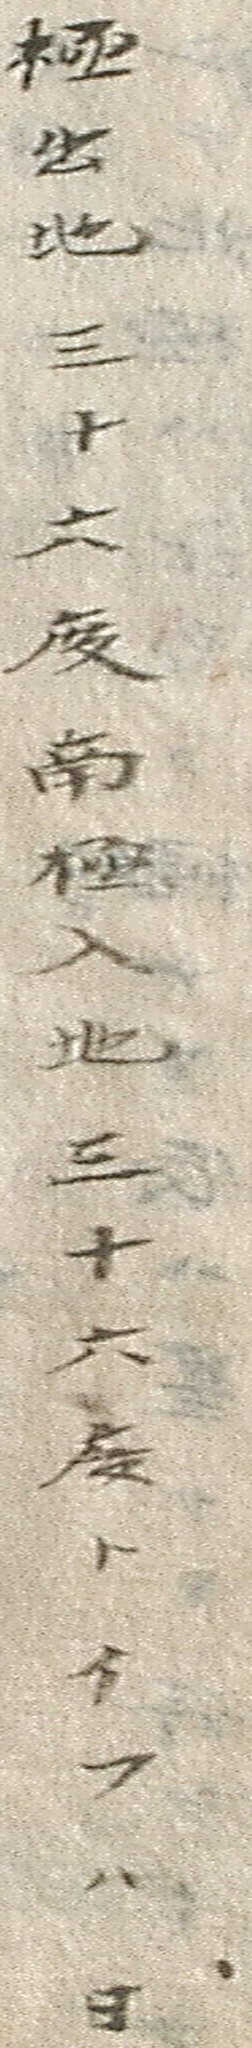極出地三十六度南極入地三十六度トイフハ日
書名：天學便蒙図説
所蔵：東京大学地震研究所図書室 Earthquake Research Institute Library, The University of Tokyo, JAPAN
